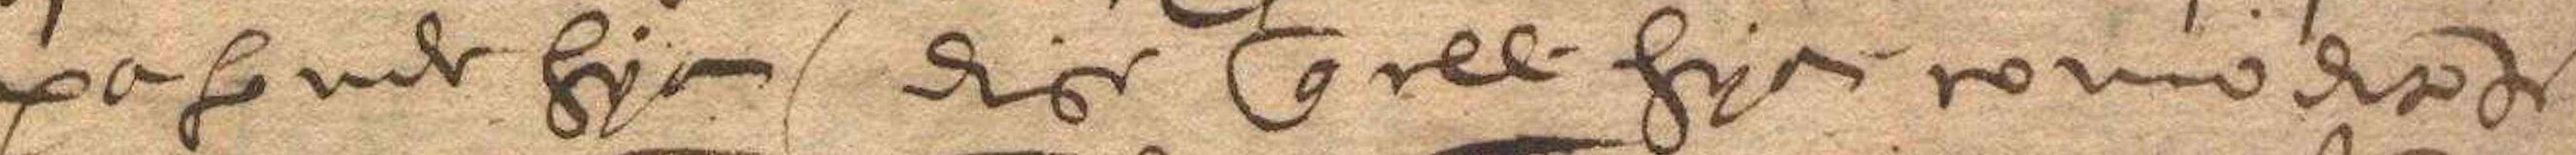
ꝑa honde hya / dise q̄ elle hya como dito tē
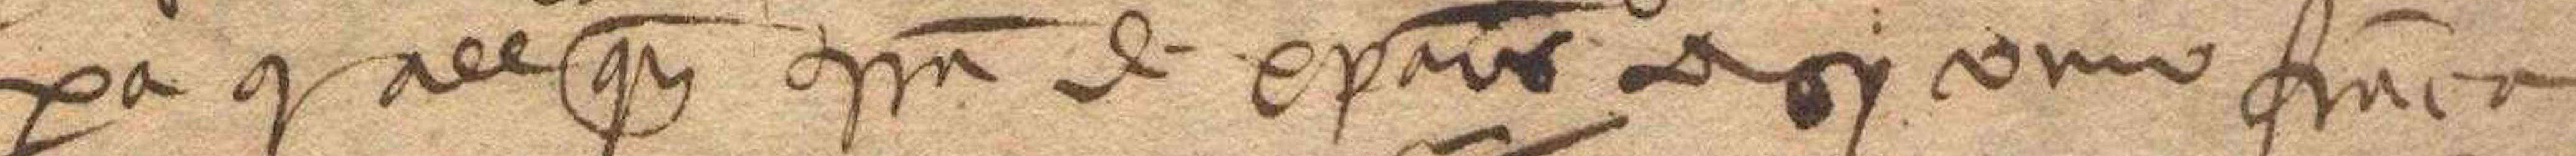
ꝑa quallq̄r trr̄a de xpãos asy como frāça
